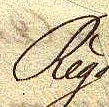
Rego
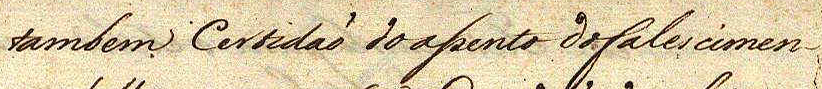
tambem Certidaõ do assento do falescimen
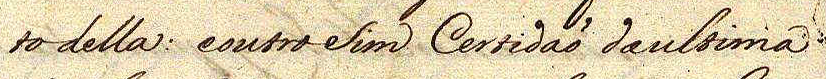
to della: e outrosim Certidaõ da ultima.
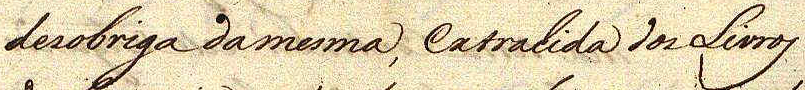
desobriga da mesma, Extrahida dos Livros
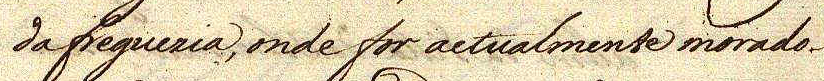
da freguezia, onde for actualmente morado
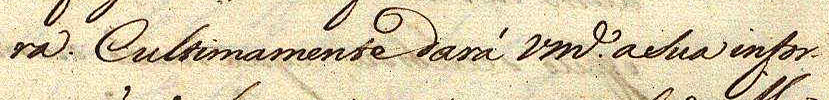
ra. E ultimamente dará v m.e a sua infor
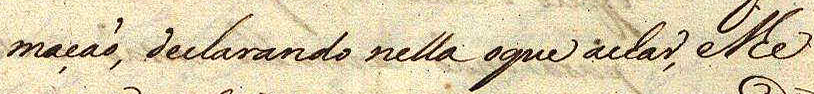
mação, declarando nella o que achar, e lhe
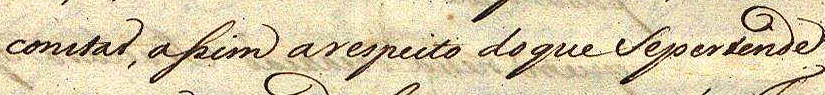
constar, assim a respeito do que se pertende
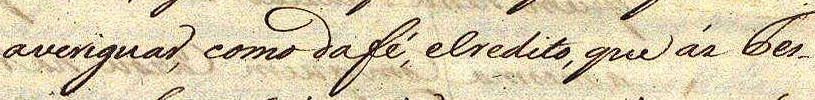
averiguar, como da fé, e credito, que as Tes
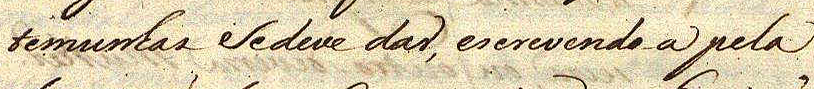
temunhas se deve dar, escrevendo-a pela
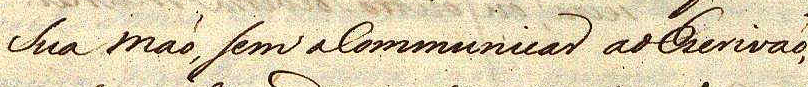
Sua maõ, sem a Communicar ao Escrivaõ,
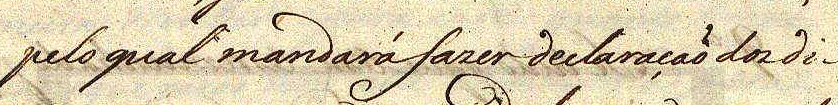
pelo qual mandará fazer declaraçaõ dos di
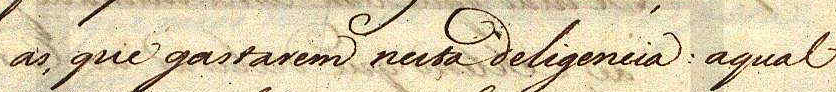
as, que gastarem nesta deligencia: a qual
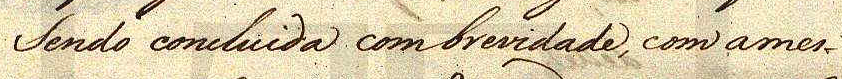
Sendo concluida com brevidade, com a mes
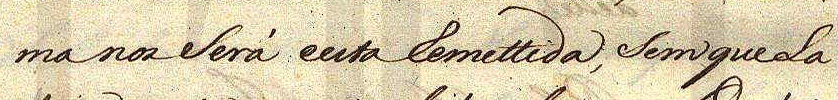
ma nos Será e esta Remettida, sem que La
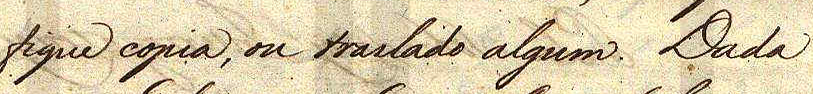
fique copia, ou traslado algum. Dada
